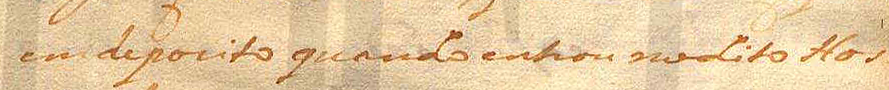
em deposito quando entrou no dito Hos
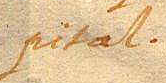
pital.
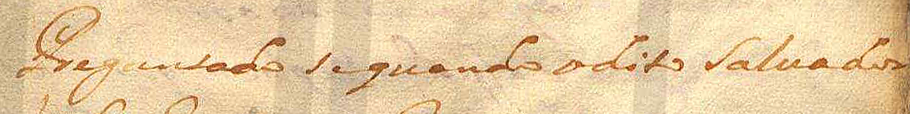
Preguntado se quando o dito saluador
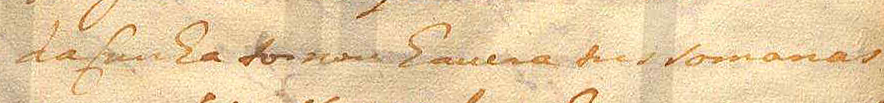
da Cunha tornou hauera tres somanas
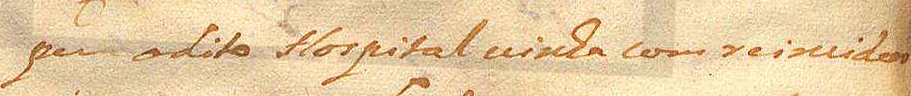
pera o dito Hospital uinha com reinciden
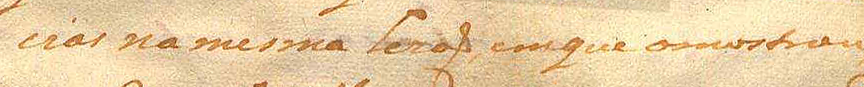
cias na mesma lezaõ, em que o mostrou,
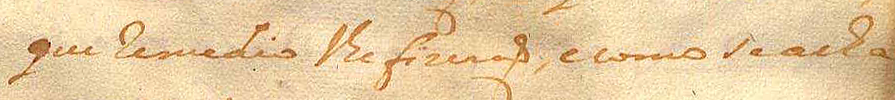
que Remedio lhe fizeraõ, e como se acha
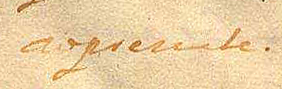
ao presente.
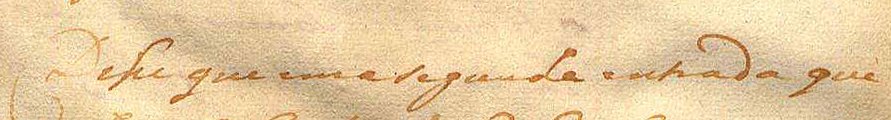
Disse que em a segunda entrada que
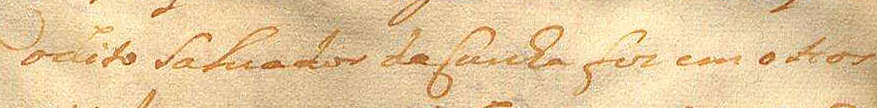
o dito Saluador da Cunha fez em o Hos
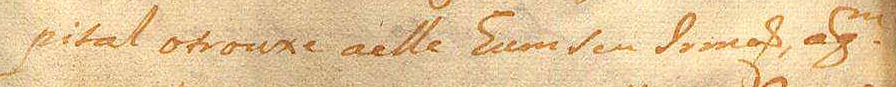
pital o trouxe a elle hum seu Irmaõ, a q.m
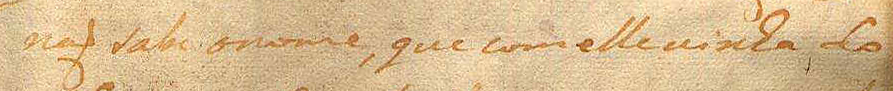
naõ sabe o nome, que com elle uinha do
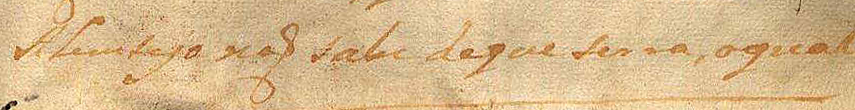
Alemtejo naõ sabe de que terra, o qual
